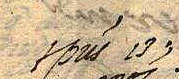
tpus̄ 13;
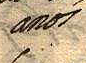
anos
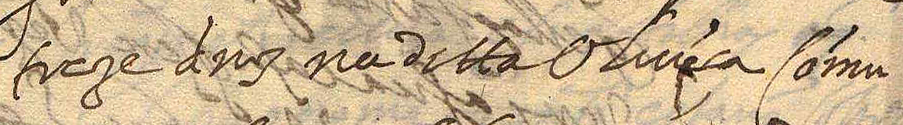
treze ānos na ditta Oliuēça Com̄u
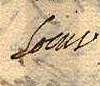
locus
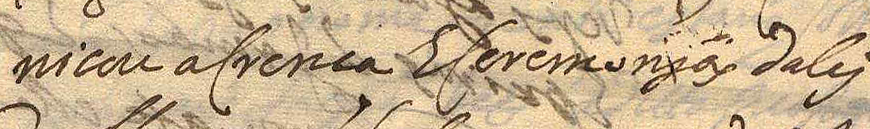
nicou a Crença E Ceremonias da lej
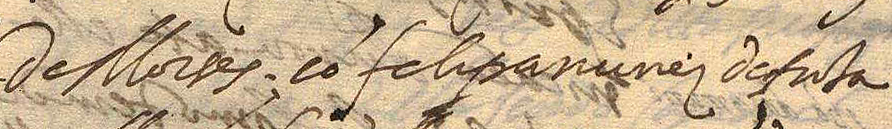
de Moises cō felipa nunez defūta
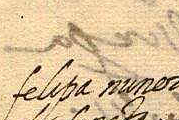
felipa nunez
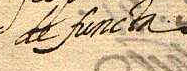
defuncta
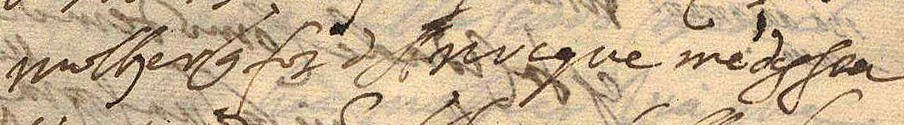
molher q̄ foi dAnrique mēdes seu
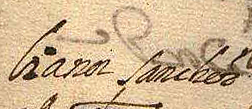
lianor sanchez
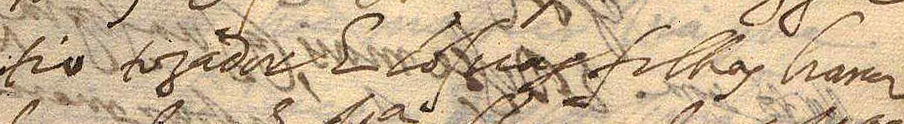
tio tozador E cō suas filhas Lianor
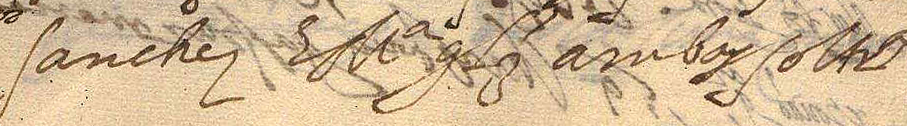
Sanchez E Ma glz̄ ambas soltras
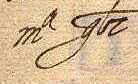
ma gl̄z
